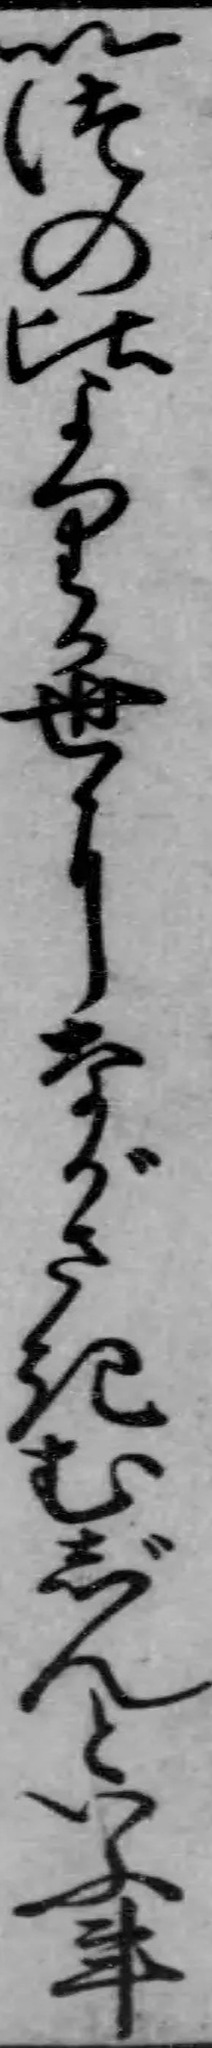いつの比よりか世にながさきむじんといふ事
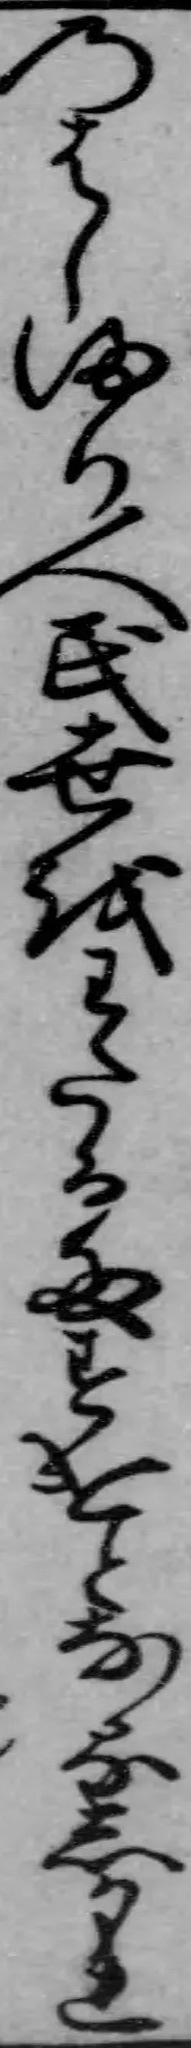のはしまり人民世をわたるたすけとなるしかれ
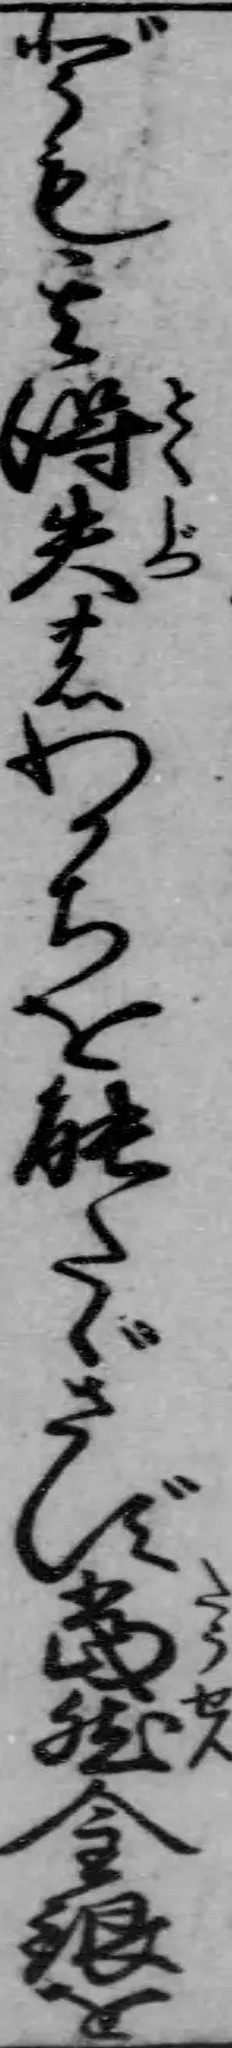ども其得失のわかちを能たゞさず当然金銀を
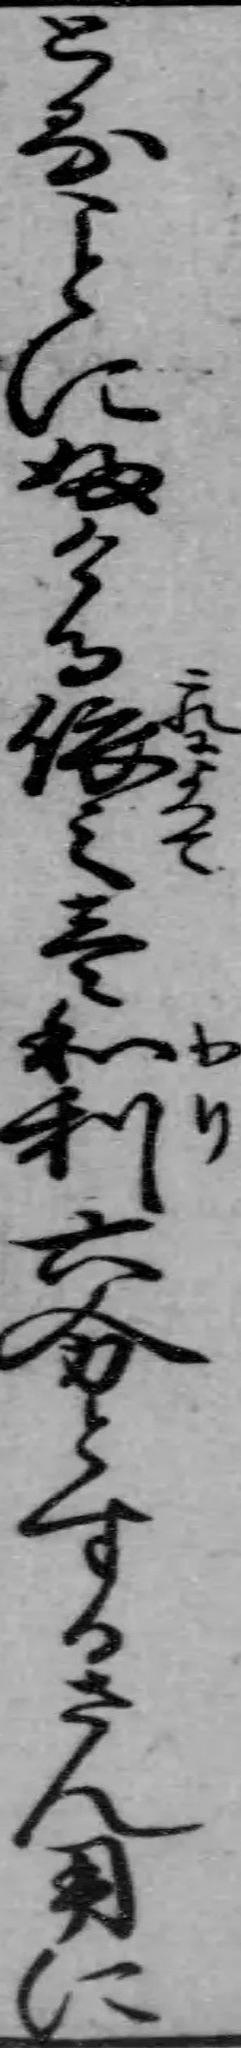とることにふける依の壱和利六分とするさん用に
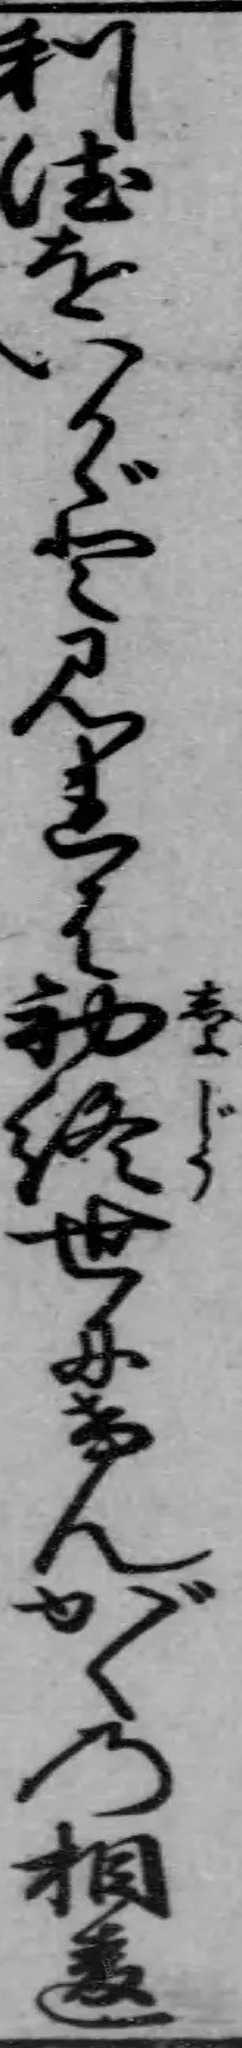利徳をいかゞと見れは初終世にけんがくの相違
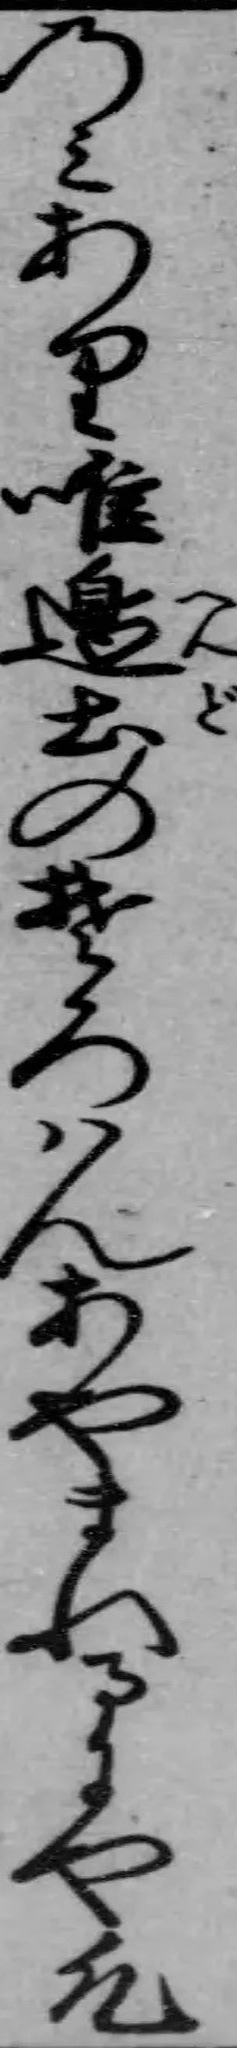のみあり唯辺土のそろはんあやまれるにや凡
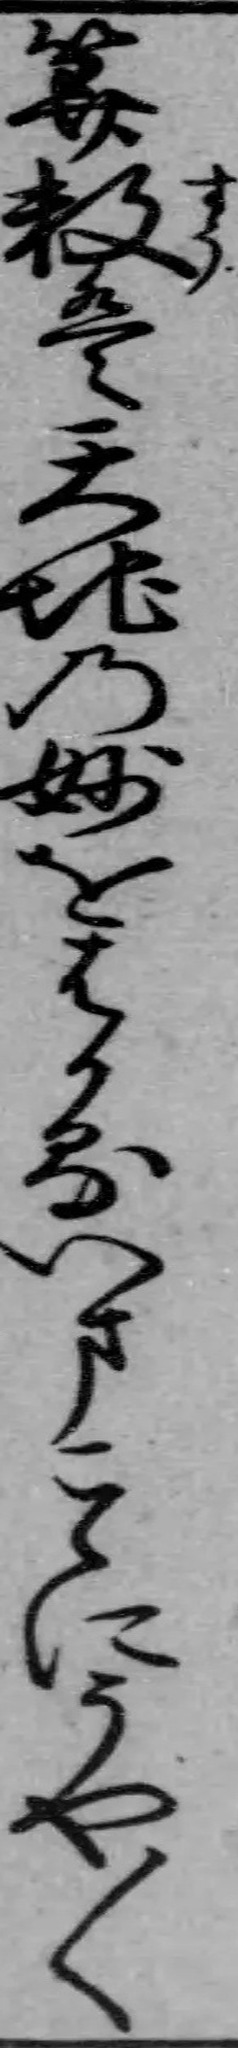算数は天地の妙をはかるいまこゝにうや〳〵
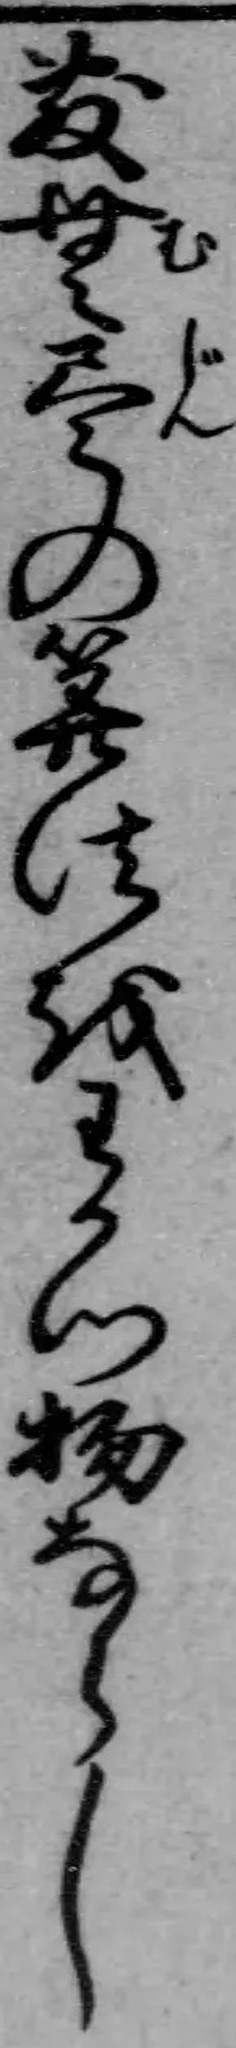敷無尽の算法をわかつ物ならし
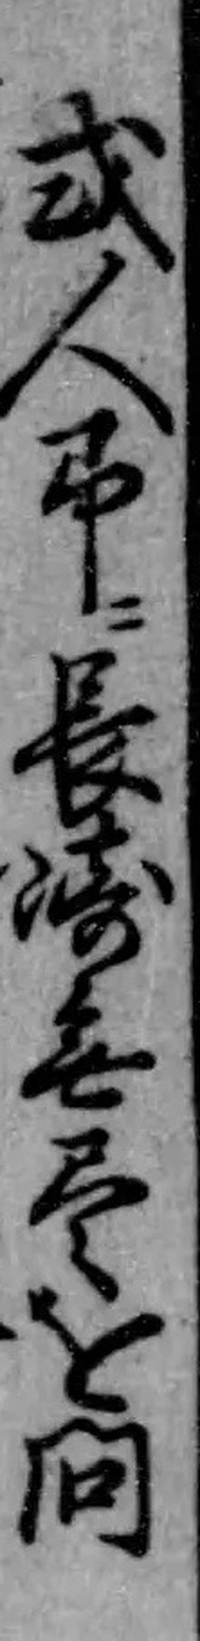或人予に長崎無尽を問
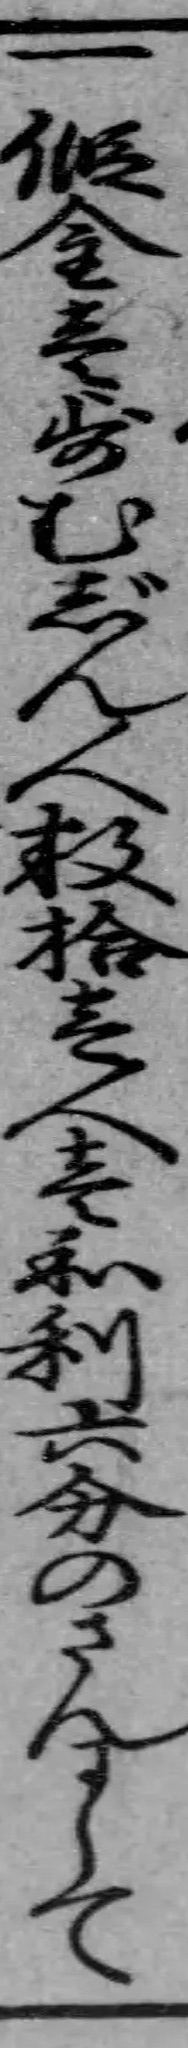一仮金壱歩むじん人数拾壱人壱和利六分のさんにして
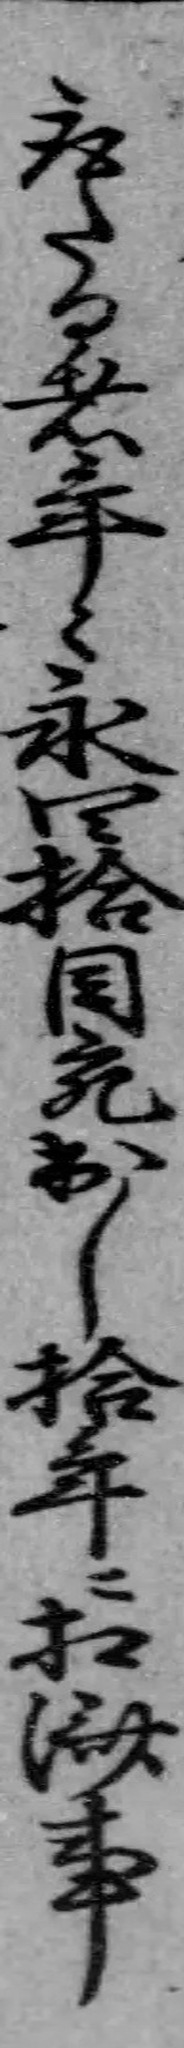取たる者年々永四拾目宛出し拾年に相済事
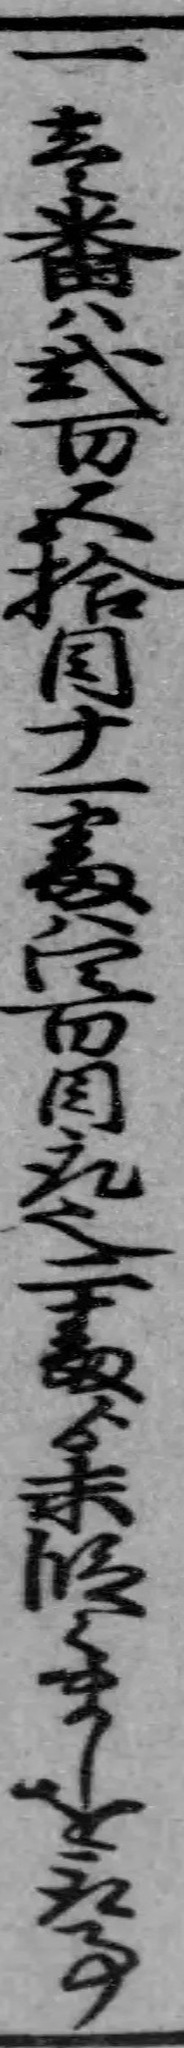一壱番は弐百五拾目十一番は四百目取也二番より末段々ましを取事
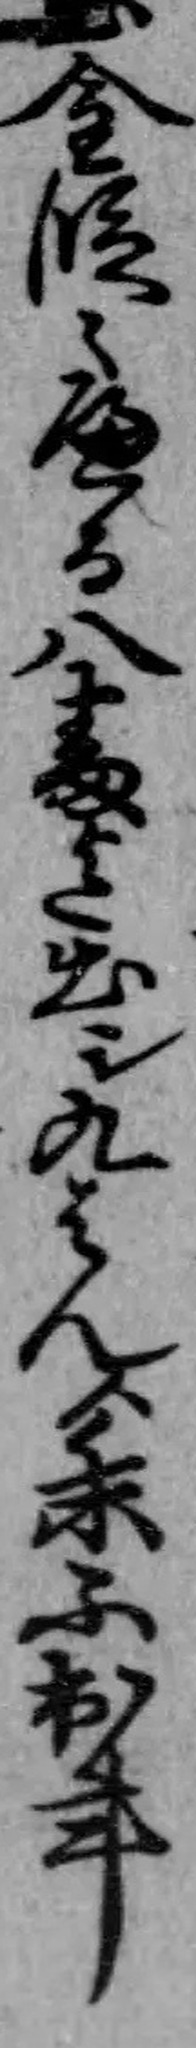金段々へる八番迄出し九はんより末不出事
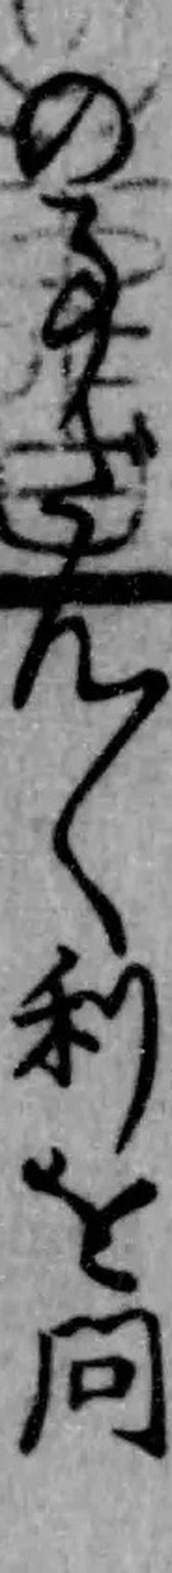の事だん〳〵利を問
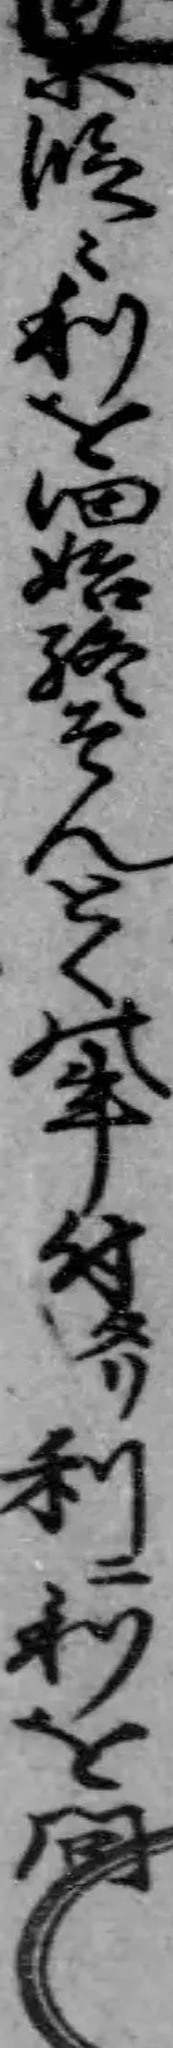一末段々利を問始終そんとくの事付たり利に利を問
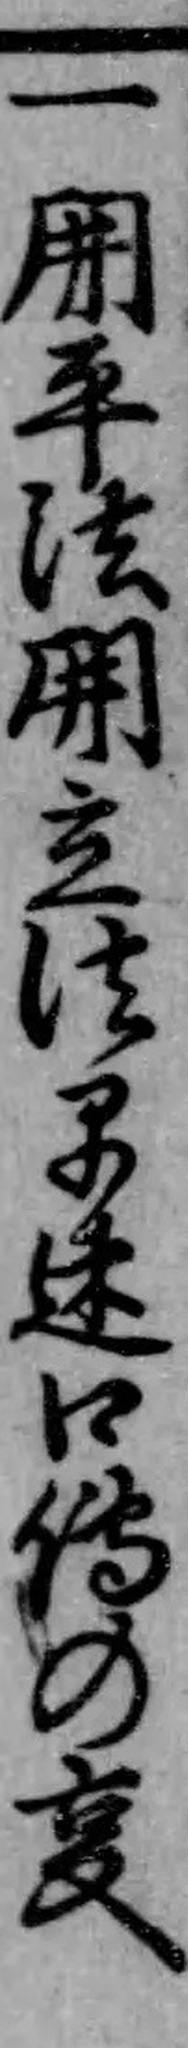一開平法開立法早速口伝の事
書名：長崎むじん物語 大正15 米山堂
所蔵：国立国会図書館 National Diet Library, JAPAN
